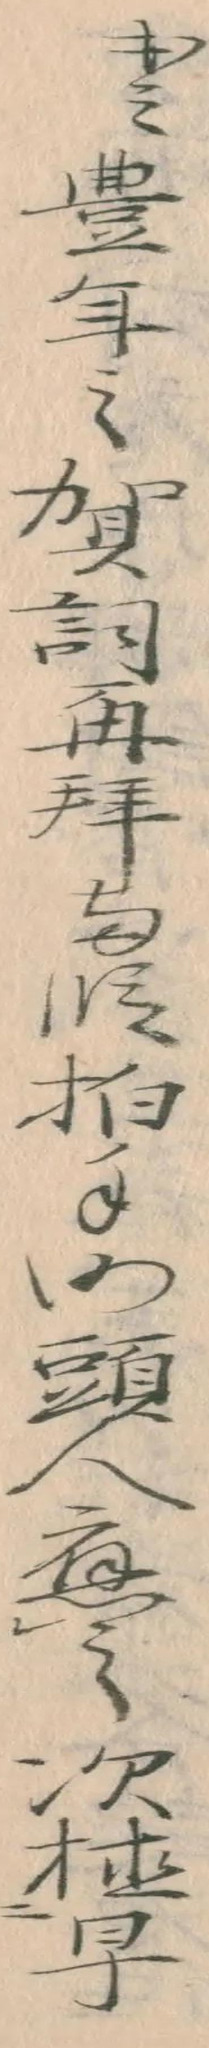本之豊年之賀詞再拝両段拍手仍頭人應之次植早
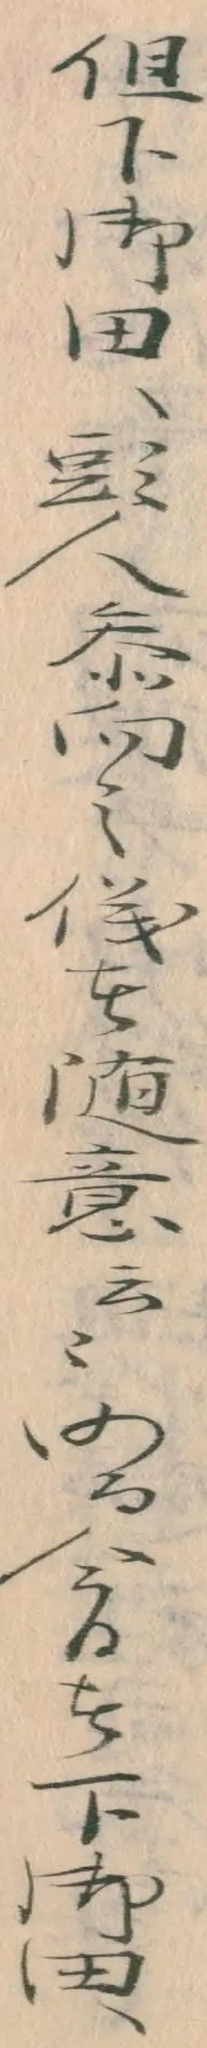但下御田へ頭人参向之儀は随意云々仍而今日は下御田へ
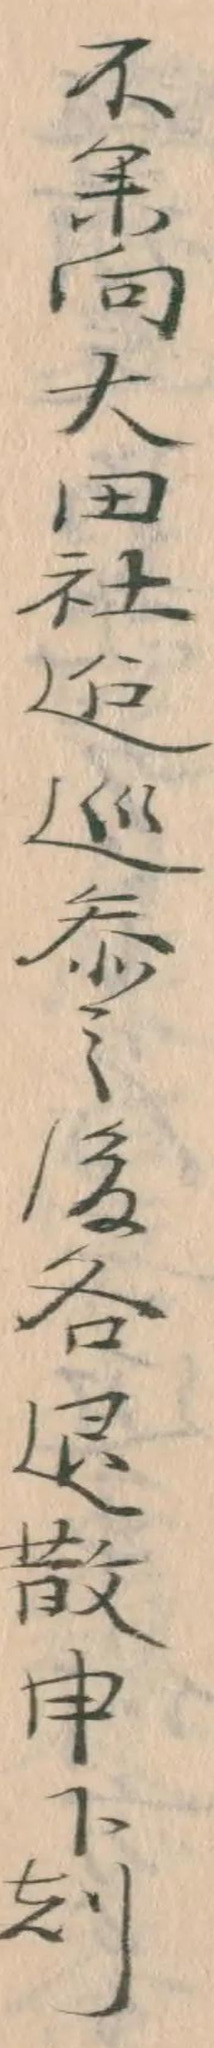不参向大田社迄巡参之後各退散申下刻
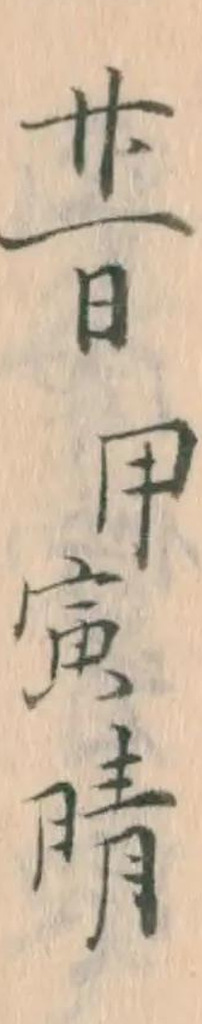廿一日甲寅晴
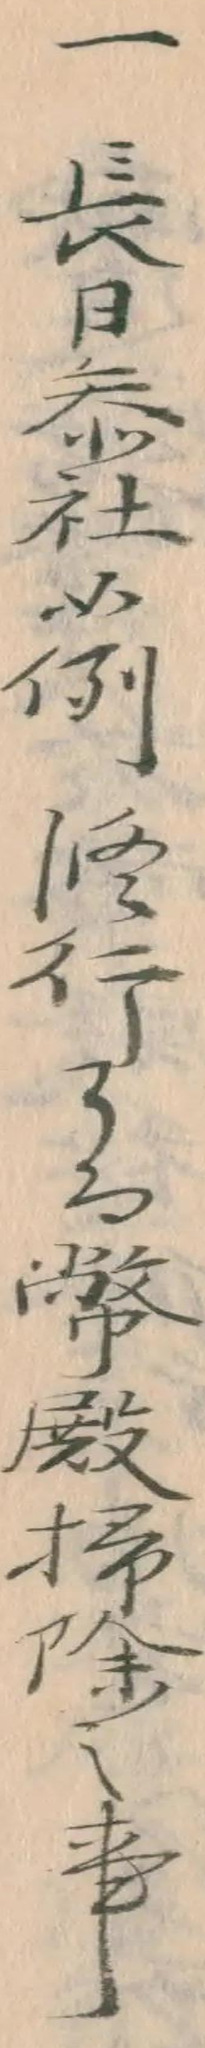一長日参社如例修行了而幣殿掃除之事
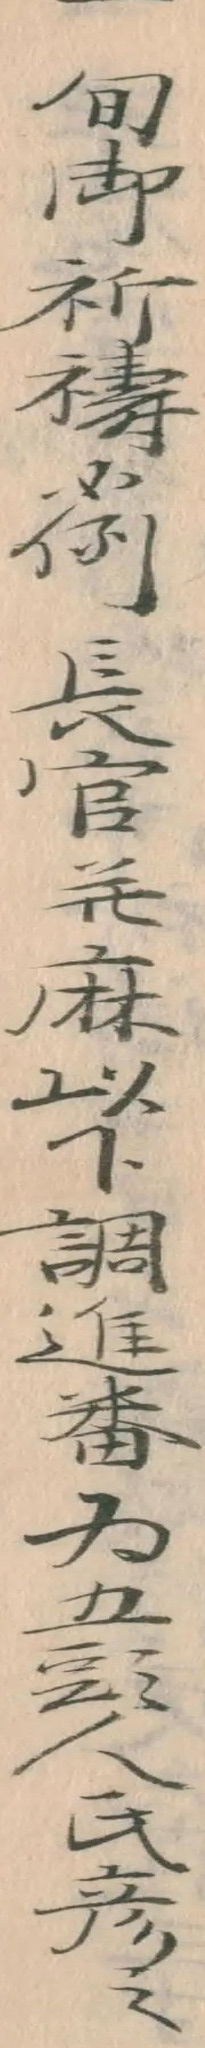一旬御祈祷如例長官并麻以下調進番為五頭人民彦之
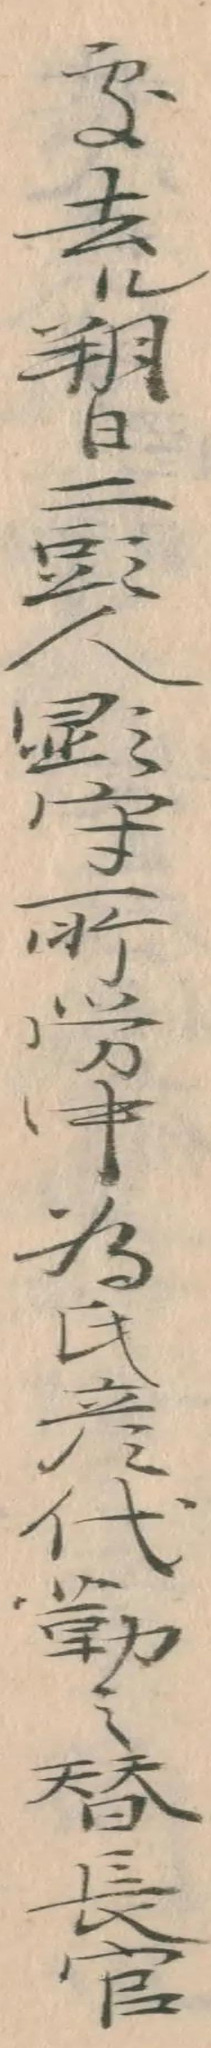處去ル朔日二頭人顕守所労中為氏彦代勤之替長官
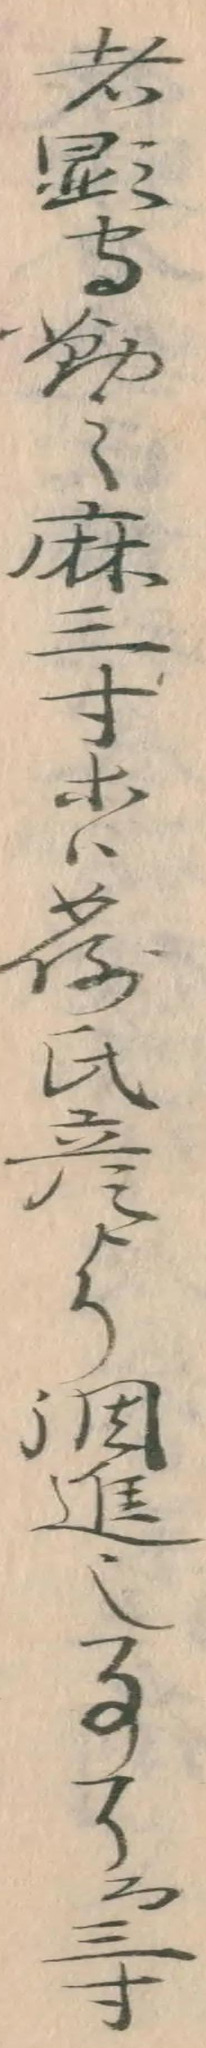者顕守勤之麻三寸等ハ如例氏彦より調進之事了而三寸
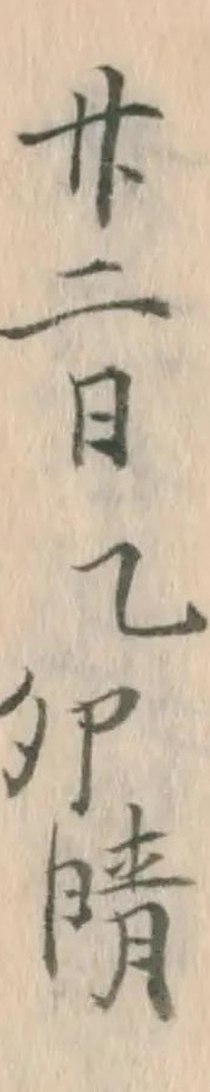廿二日乙卯晴
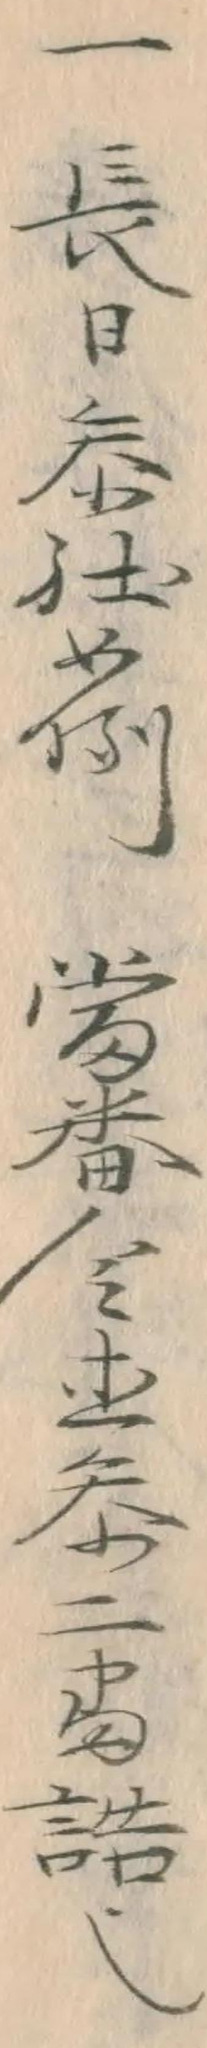一長日参社如例當番令直参二番詰也
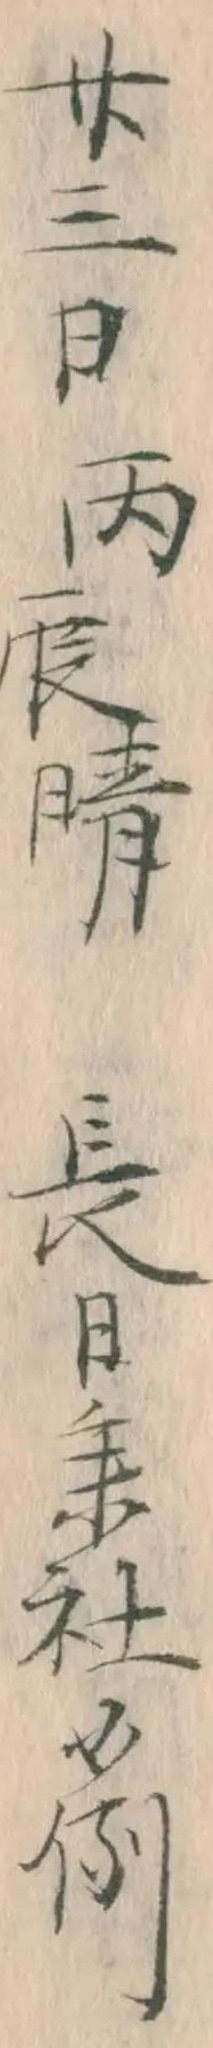廿三日丙辰晴長日参社如例
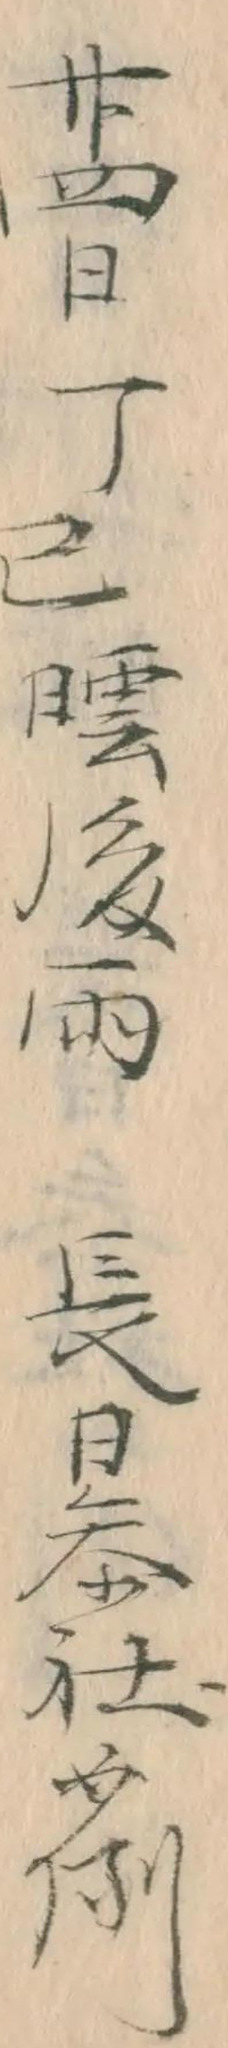廿四日丁巳曇後雨長日参社如例

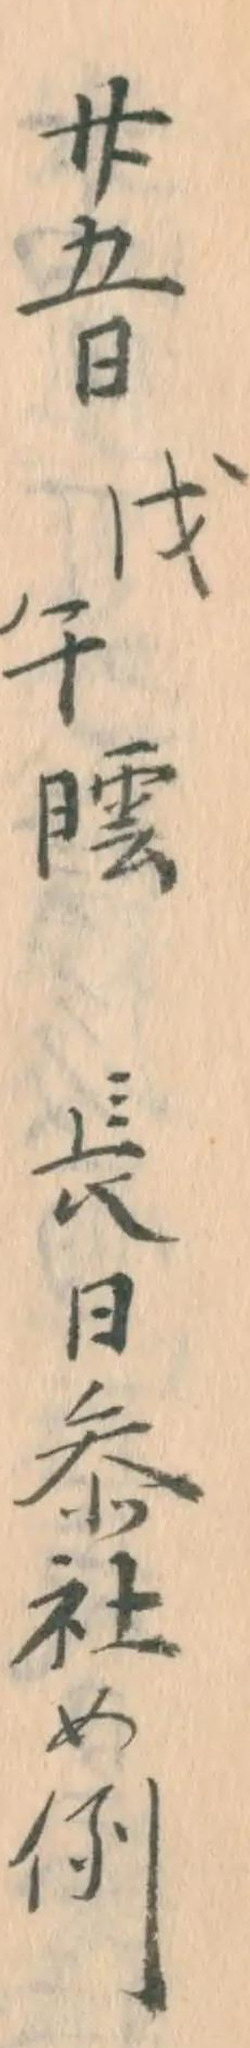二十五日戊午曇長日参社如例
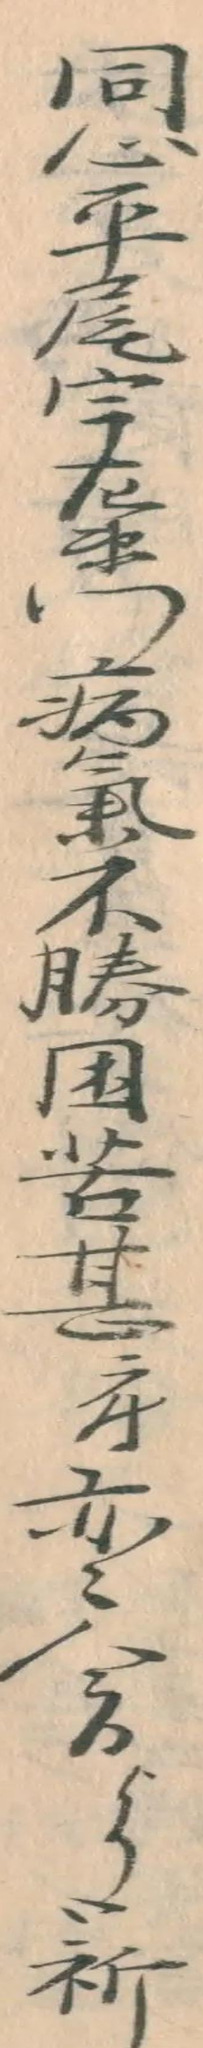一同心平尾宇左衛門病氣不勝困苦甚ニ付亦々今日より御祈
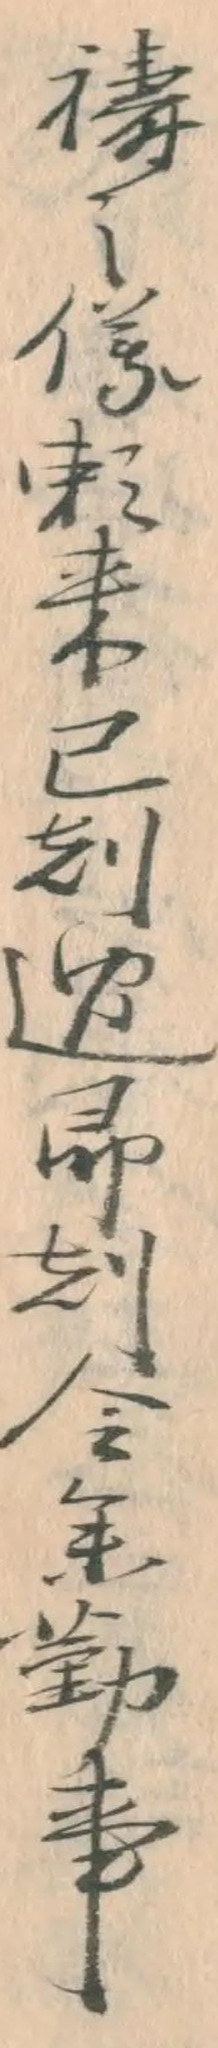祷之儀頼来巳刻過即刻令参勤事
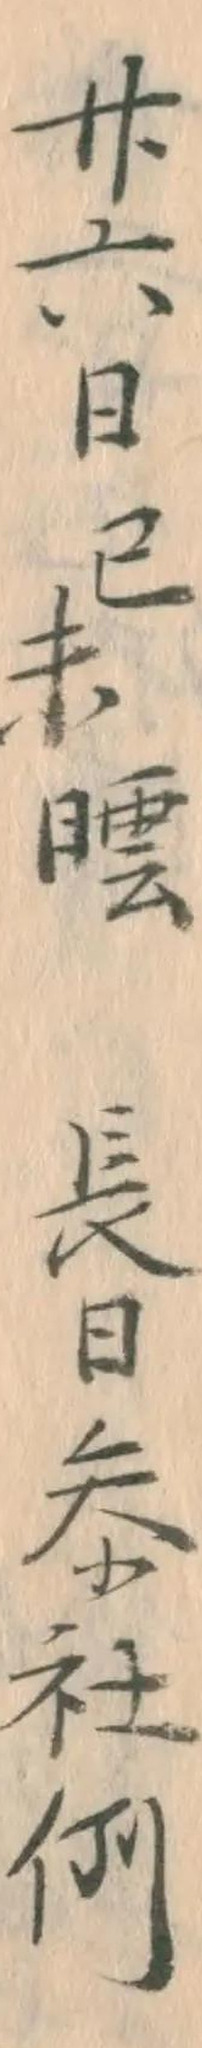廿六日己未曇長日参社例
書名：賀茂社記録. 第73冊
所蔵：国立国会図書館 National Diet Library, JAPAN
